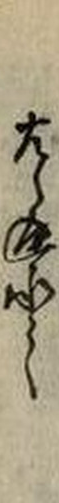左之通承之
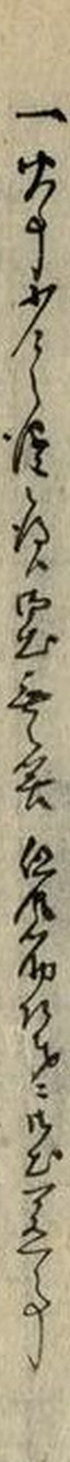一火事少々之儀に候得は御出無之筈但風筋次第に御出可有之事
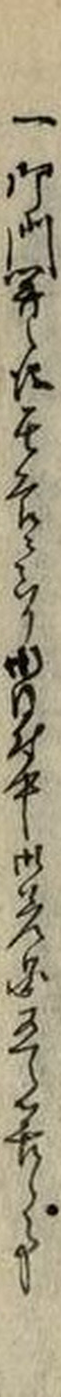一御門開候儀其節に至り御目付中御差図有之筈之事
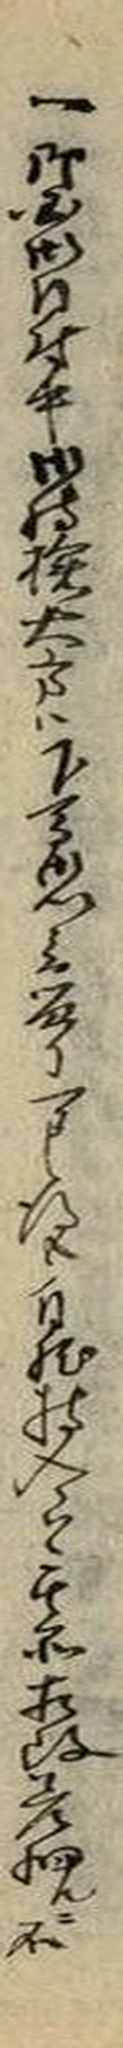一御国目付中御持槍大方ハ下馬御門ニ而留り可申候得共自然持入候ハヽ其品相改差押ルニ不
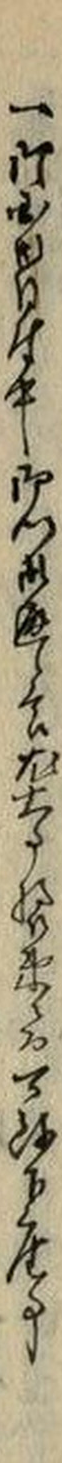一御国目付中御門御通候節尤火事装束に而可致下座事
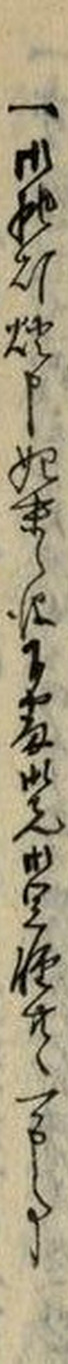一御挑灯燈申始末之儀下番御先御足軽共へ可申事
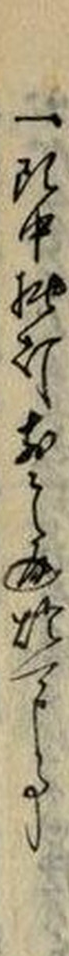一頭中挑灯前々之通灯可申事
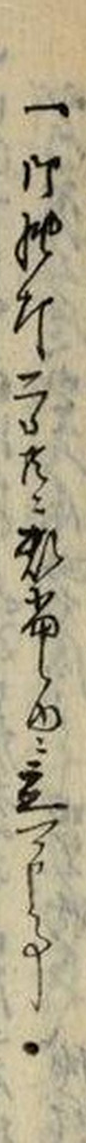一御挑灯二ツ共に頬当之内に立可申事
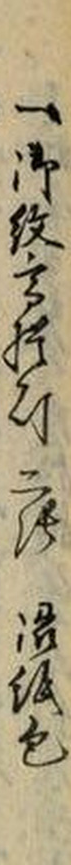一御紋高挑灯二張渋紙色
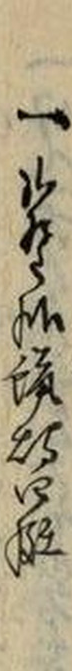一弐拾匁掛蝋燭四挺
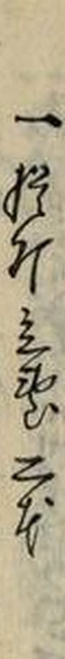一提灯立台二本
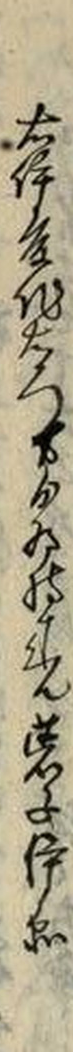右伊藤作右衛門方ゟ為持来ル荒子伊兵衛
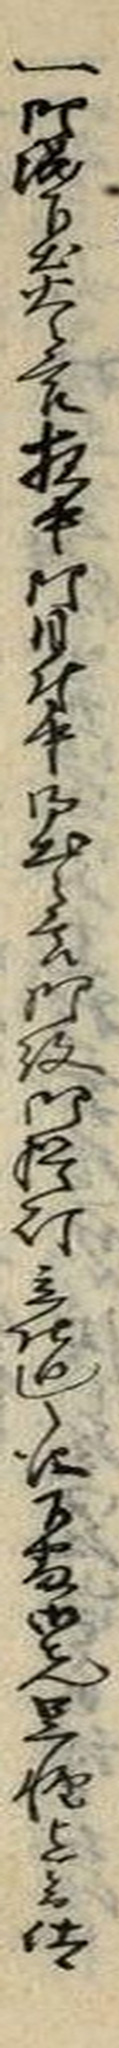一御城下出火之節夜中御目付中御出候節御紋御提灯立仕廻之儀下番御先足軽迄に而仕候
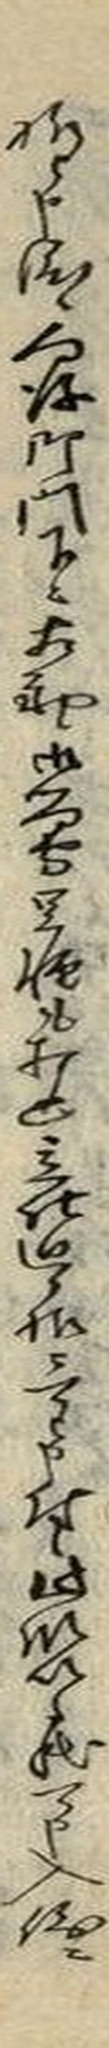様被申渡候向後御門下に相勤候御留守足軽も打込立仕廻候様に可被申付候此段以手紙可申入儀に
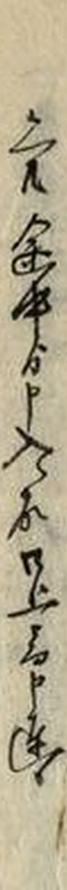候へ共途中ゟ申入候故口上に而申達候
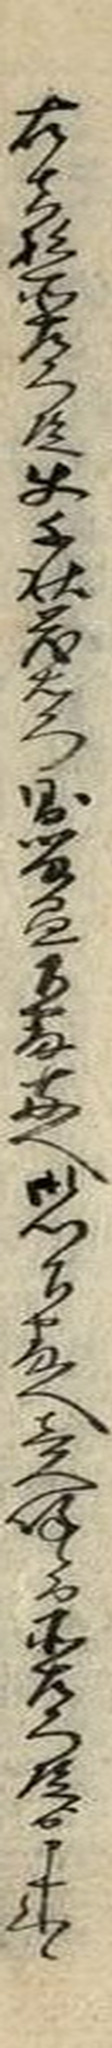右真杉所左衛門殿使千秋茂右衛門則留置下番両人御門下番人壱人呼候而所左衛門殿ゟ申来候
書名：御門御櫓之部
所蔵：福井県文書館 Fukui Prefectural Archives
